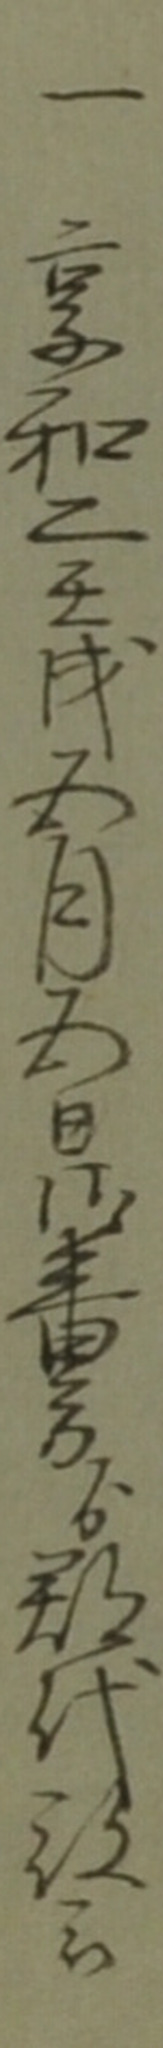一享和二壬戌五月五日御番方ゟ郡代役被
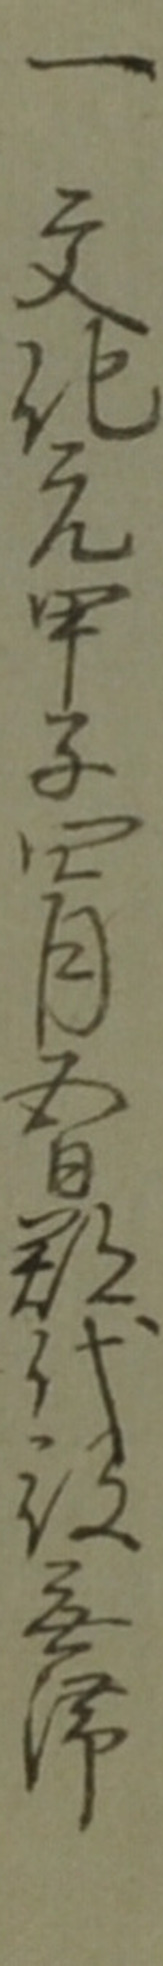一文化元甲子四月五日郡代役無滞
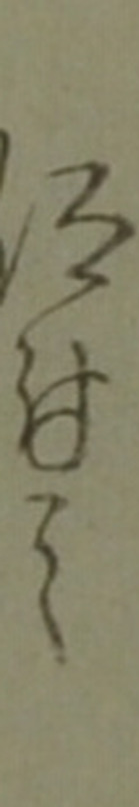仰付之
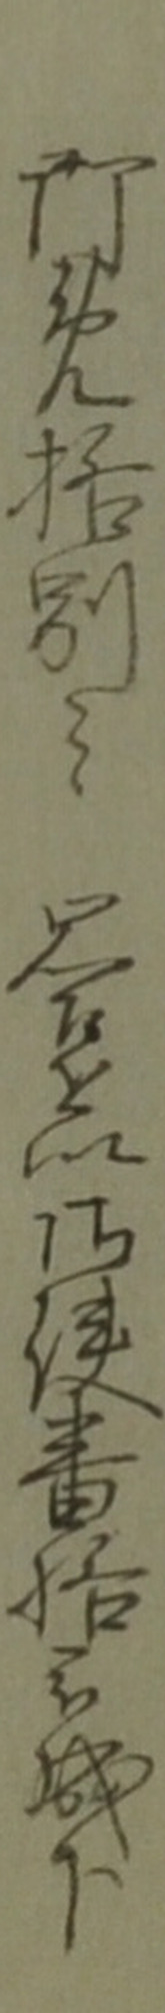御免格別之思召を以御使番格被成下
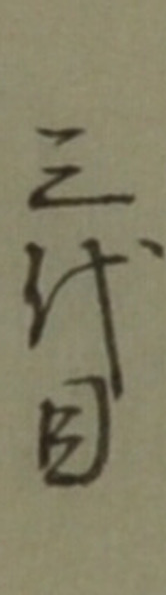三代目
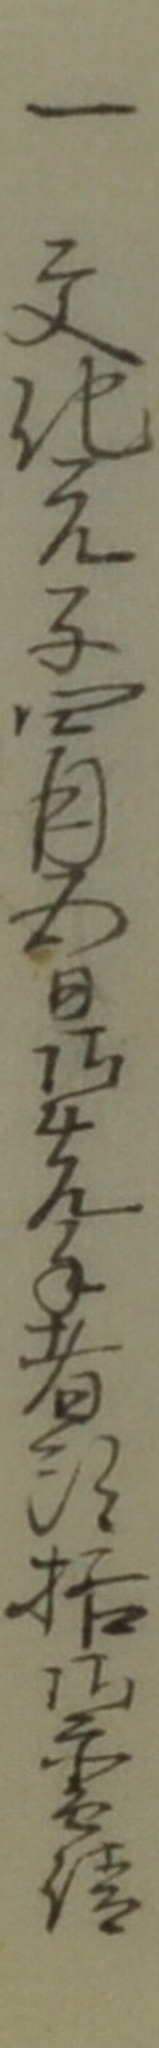一文化元子四月五日御先手者頭格御普請
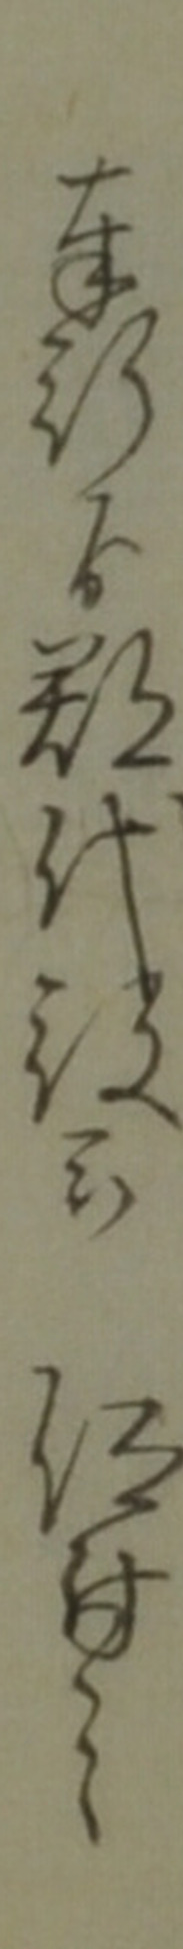奉行ゟ郡代役被仰付之
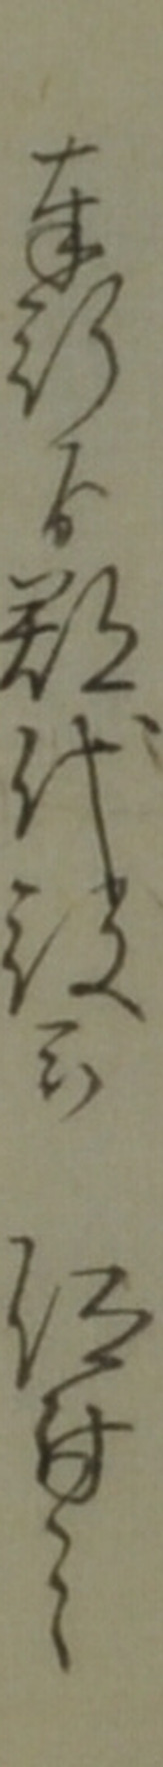奉行ゟ郡代役被仰付之
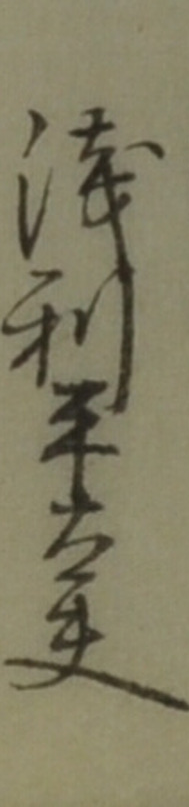浅利平太夫
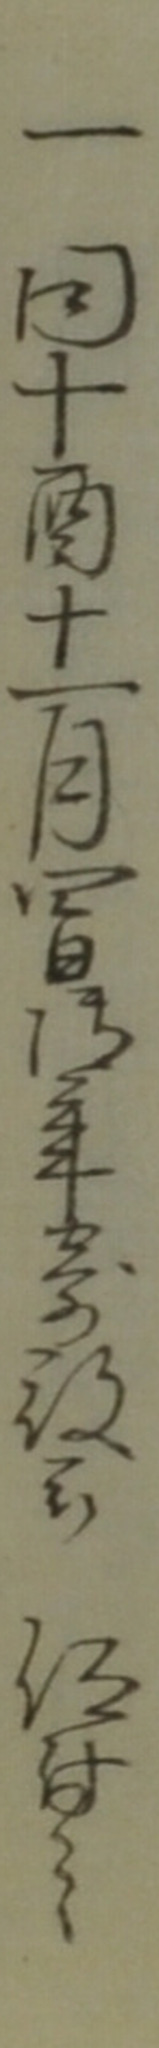一同十酉十一月四日御年寄役被仰付之
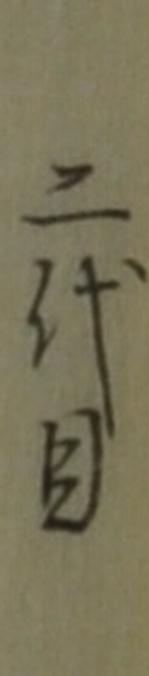二代目
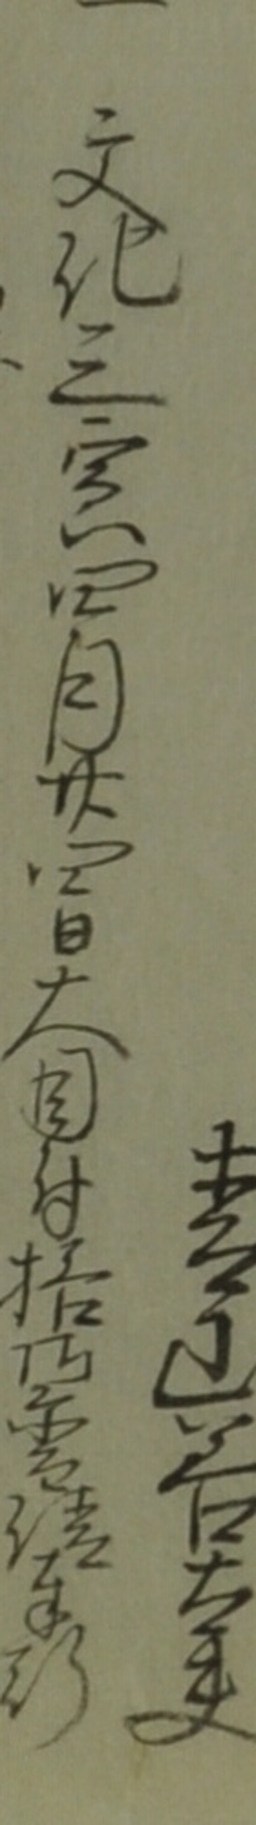一文化三寅四月廿四日大目付格御普請奉行
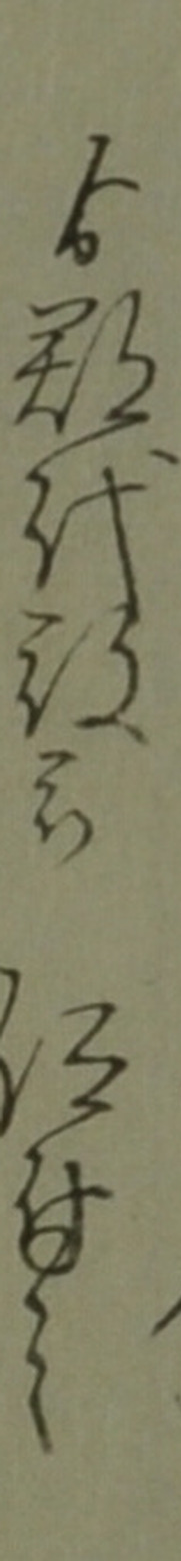奉行ゟ郡代役被仰付之
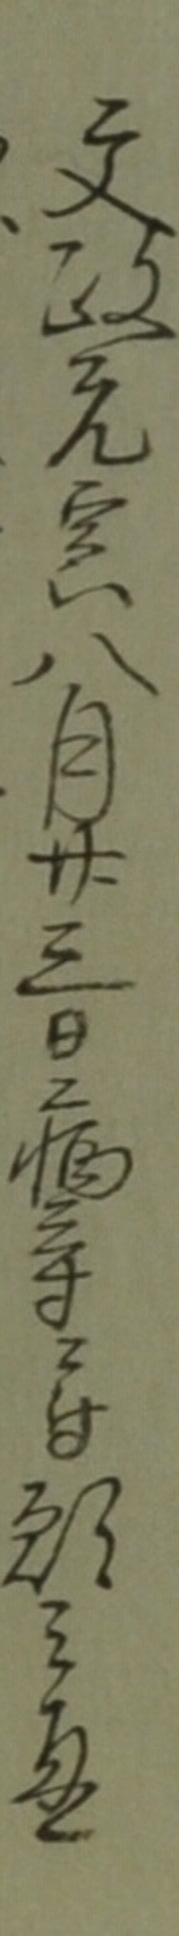一文政元寅八月廿三日病気ニ付願之通
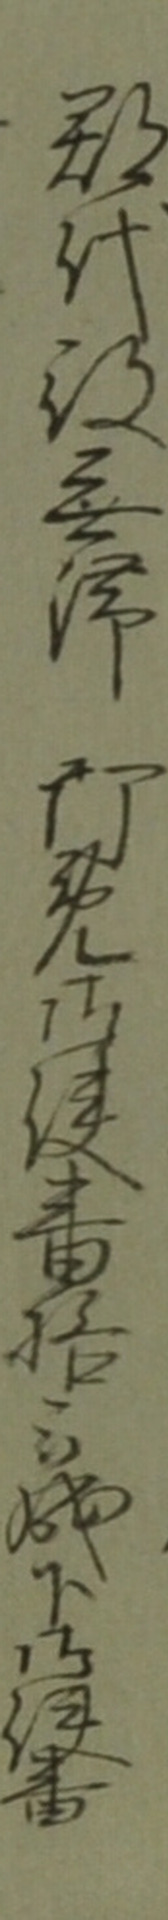郡代役無滞御免御使格被成下御使番
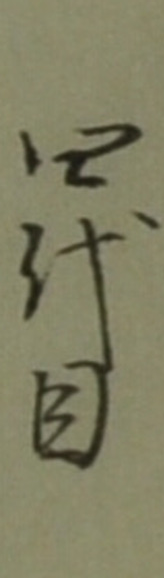四代目
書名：諸御役代々録（二）
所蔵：伊那市立高遠町図書館・合同会社AMANE
